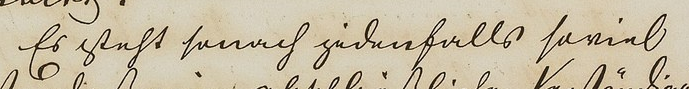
Es steht sonach jedenfalls soviel
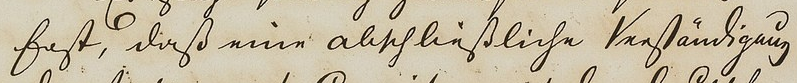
fest, daß eine abschließliche Verständigung
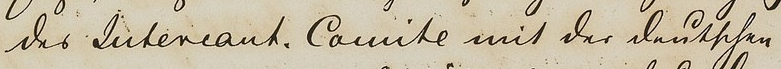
des Intercant. Comite mit der deutschen
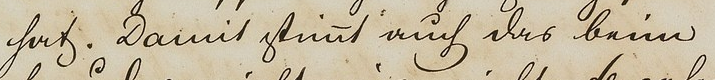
hat. Damit stimmt auch das beim
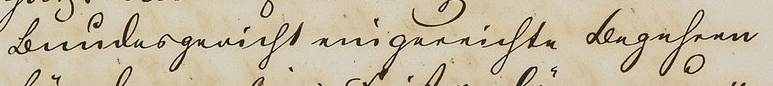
Bundesgericht eingereichte Begehren
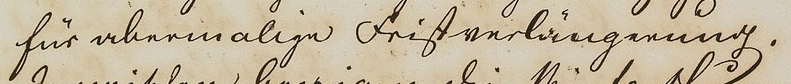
für abermalige Fristverlängerung.
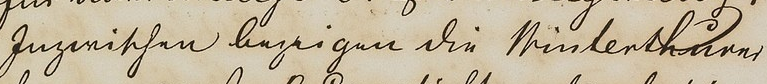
Inzwischen bezeigen die Winterthurer
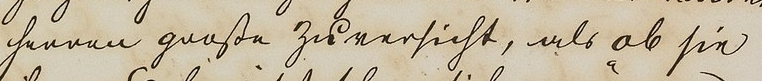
Herren große Zuversicht, als ob sie
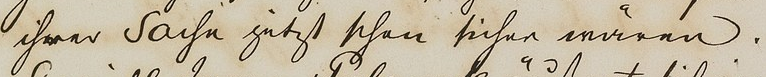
ihrer Sache jetzt schon sicher wären.
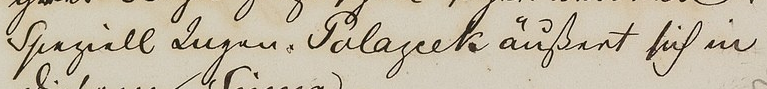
Speziell Ingen. Polazcek äußert sich in
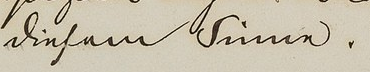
diesem Sinne.
